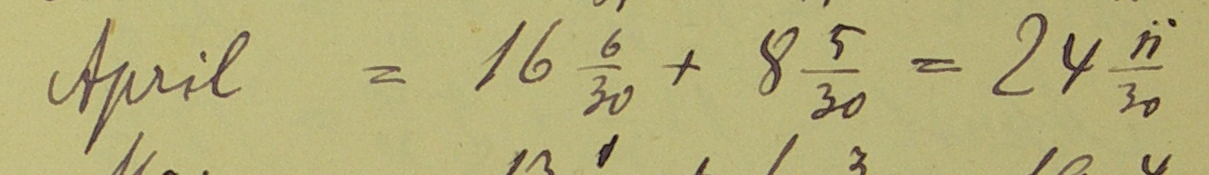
April = 16 6/30 + 8 5/30 = 24 11/30
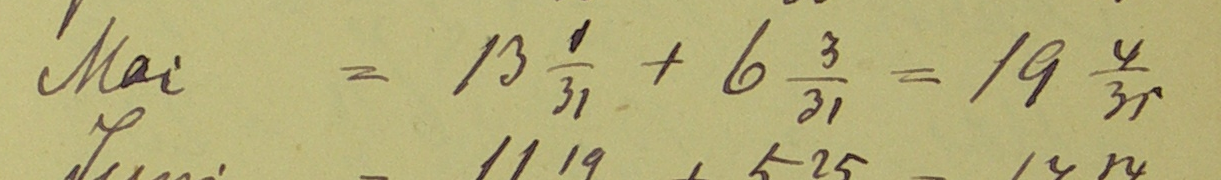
Mai = 13 1/31 + 6 3/31 = 19 4/31
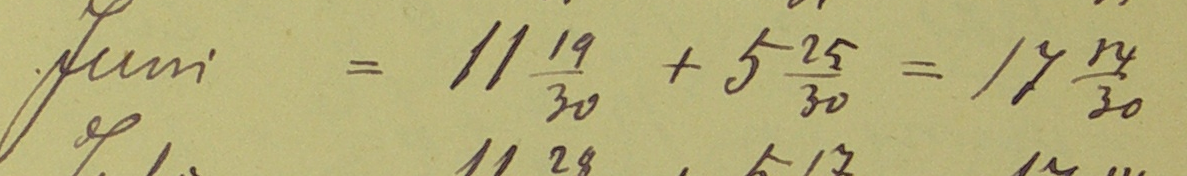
Juni = 11 19/30 + 5 25/30 = 17 14/30
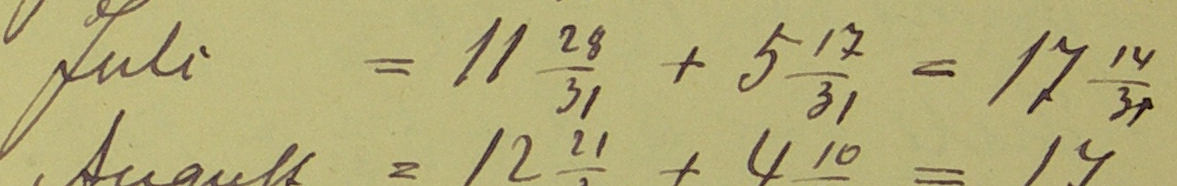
Juli = 11 28/31 + 5 17/31 = 17 14/31
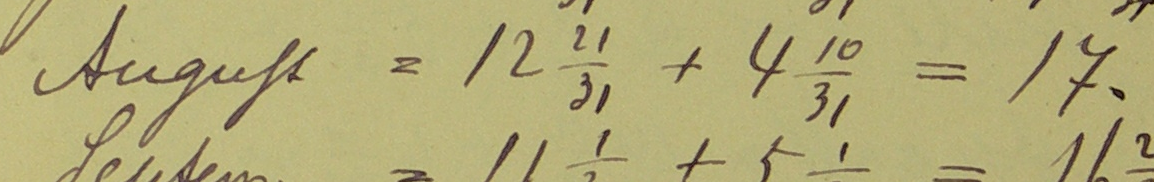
August = 12 21/31 + 4 10/31 = 17
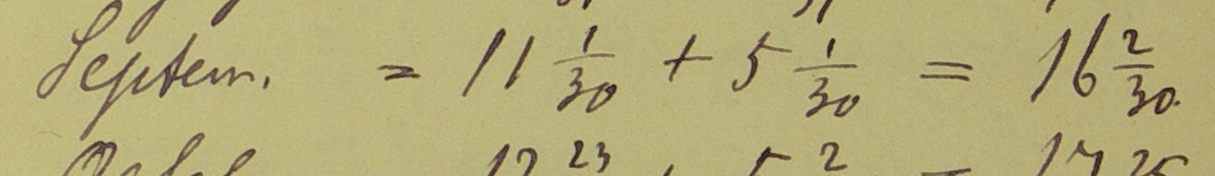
Septem. = 11 1/30 + 5 1/30 = 16 2/30
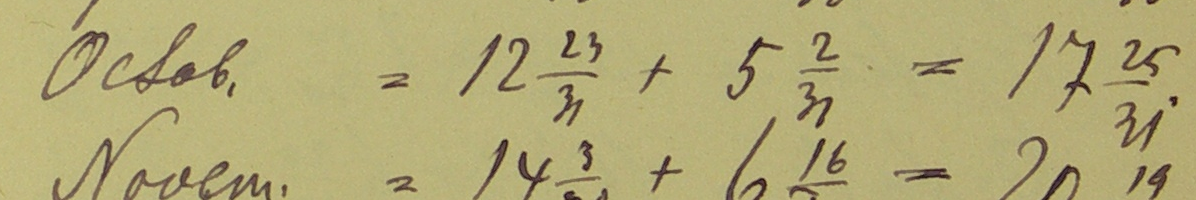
Octob. = 12 23/31 + 5 2/31 = 17 25/31
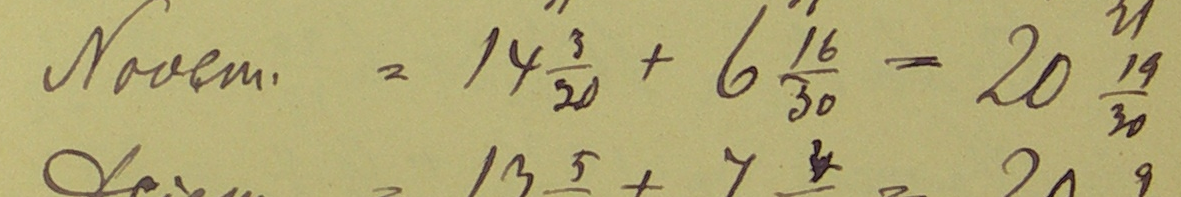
Novem. = 14 3/30 + 6 16/30 = 20 19/30
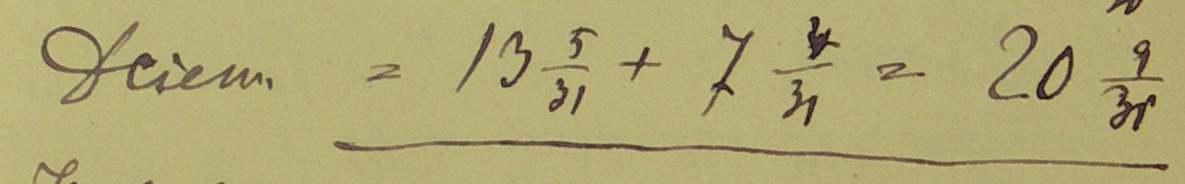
Decem. = 13 5/31 + 7 4/31 = 20 9/31
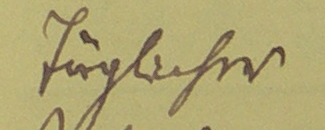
Täglicher
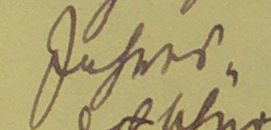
Jahres-
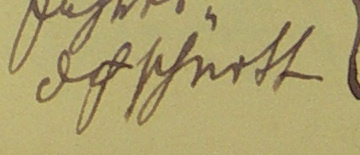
Durchschnitt
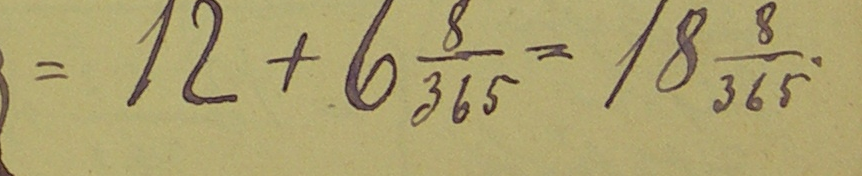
= 12 6/365 + 6 8/365 = 18 8/365
